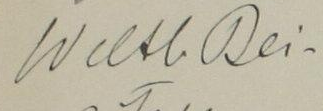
Weltl. Bei-
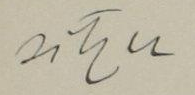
sitzer
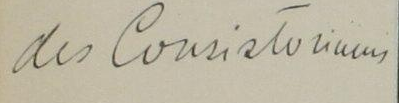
des Consistoriums
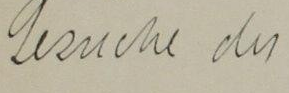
Gesuche der
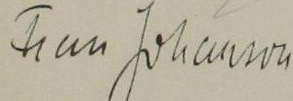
Frau Johanson
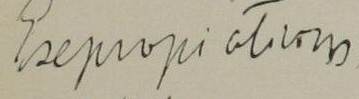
Expropiations
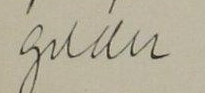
gelder
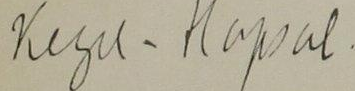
Kegel-Hapsal
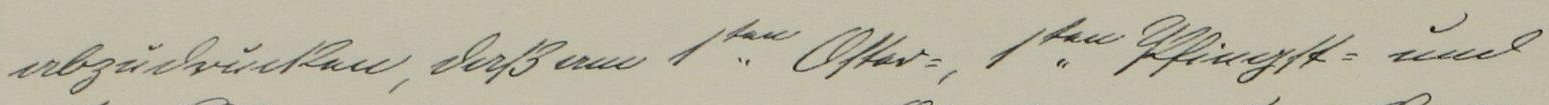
abzudrucken, daß am 1ten Oster-, 1ten Pfingst- und
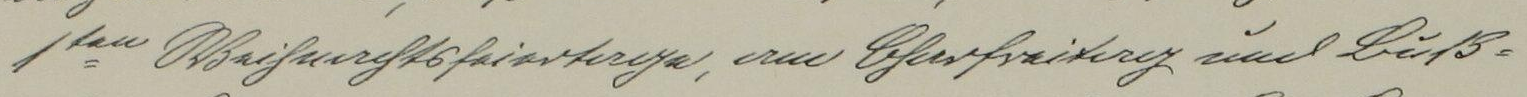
1ten Weihnachtsfeiertage, am Charfreitag und Buß-
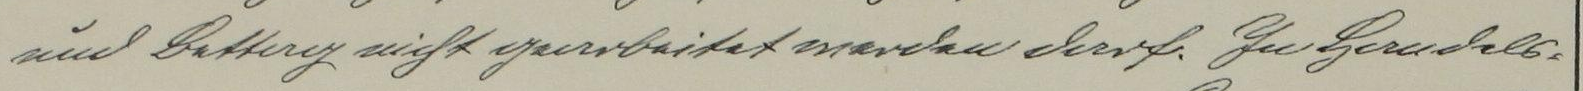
und Bettag nicht gearbeitet werden darf. In Handels-
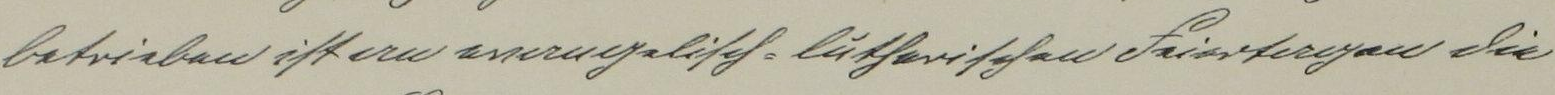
betrieben ist an evangelisch-lutherischen Feiertagen die
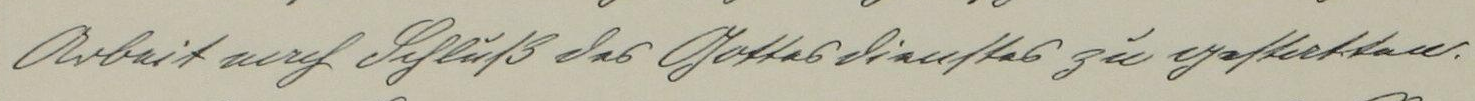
Arbeit nach Schluß des Gottesdienstes zu gestatten.
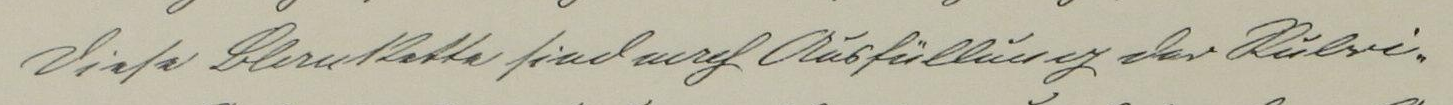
Diese Blankette sind nach Ausfüllung der Rubri-
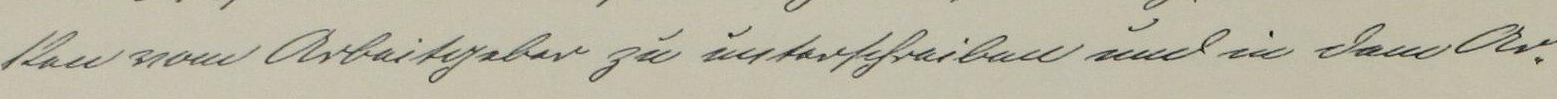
ken vom Arbeitgeber zu unterschreiben und in dem Ar-
